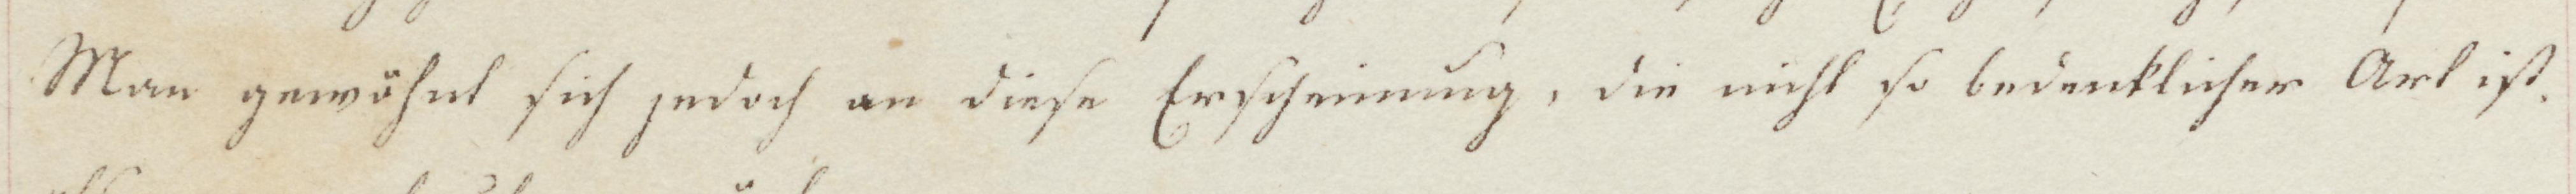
Man gewöhnt sich jedoch an diese Erscheinung, die nicht so bedenklicher Art ist,
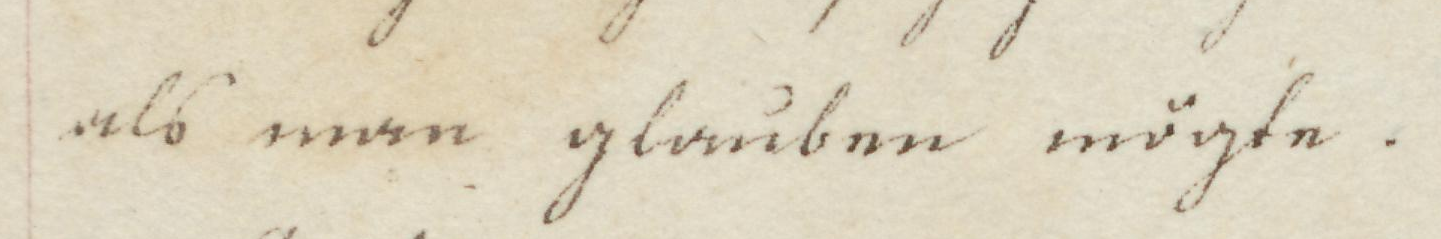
als man glauben mögte.
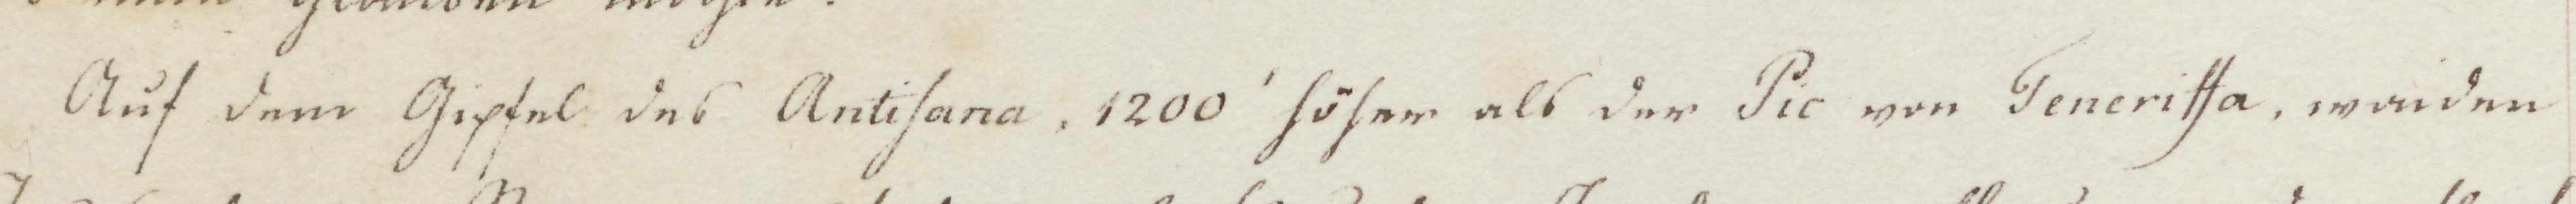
Auf dem Gipfel des Antisana, 1200′ höher als der Pic von Teneriffa, waiden
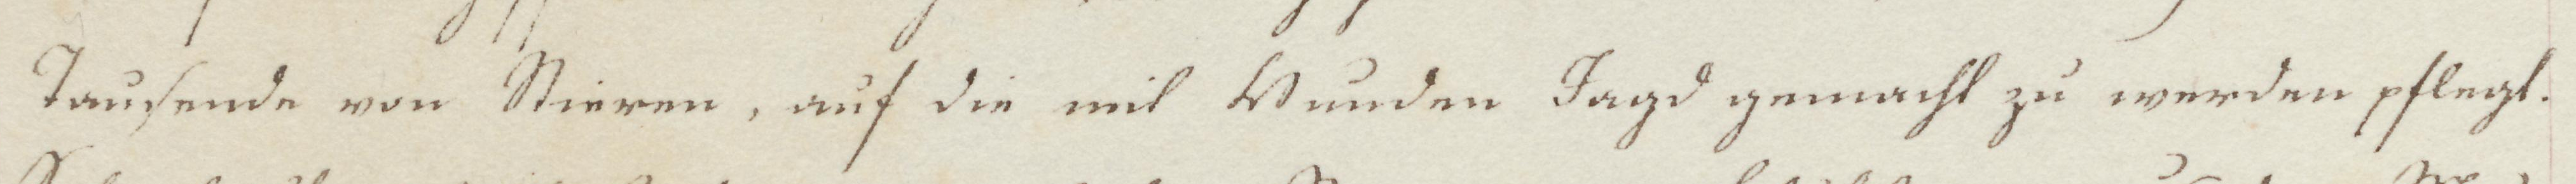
Tausende von Stieren, auf die mit Hunden Jagd gemacht zu werden pflegt.
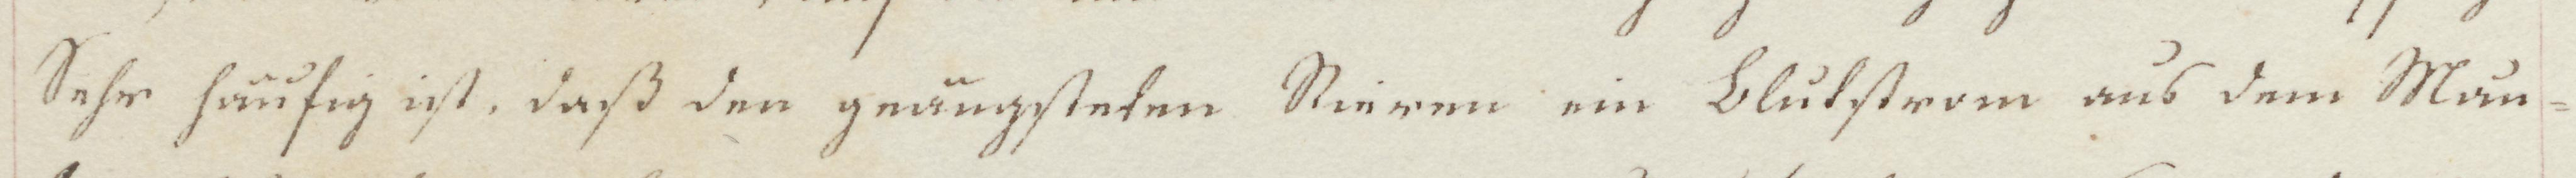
Sehr häufig ist, daß den geängsteten Stieren ein Blutstrom aus dem Mau-
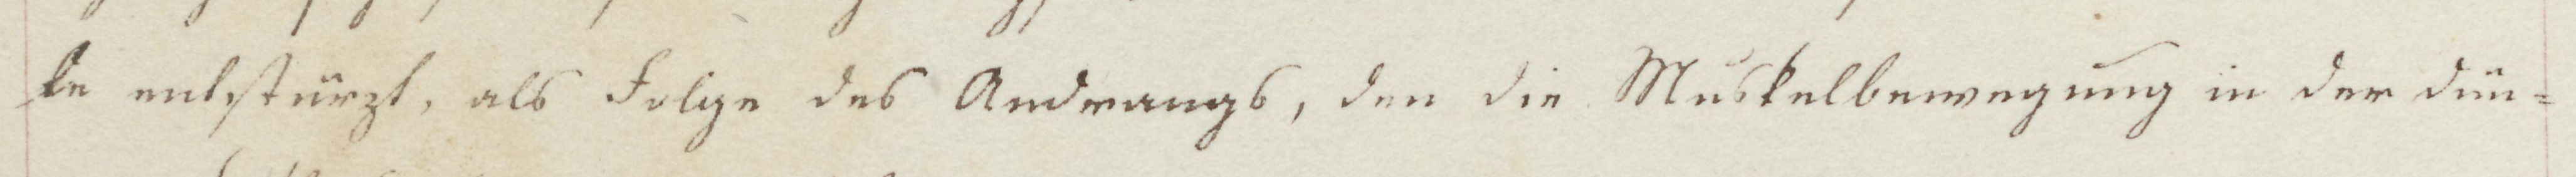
le entstürzt, als Folge des Andrangs, den die Muskelbewegung in der dün-
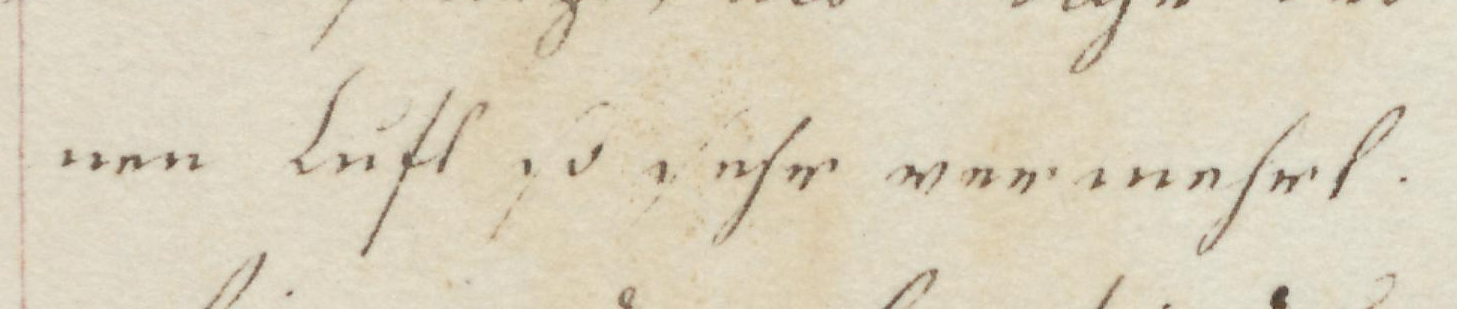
nen Luft so sehr vermehrt.
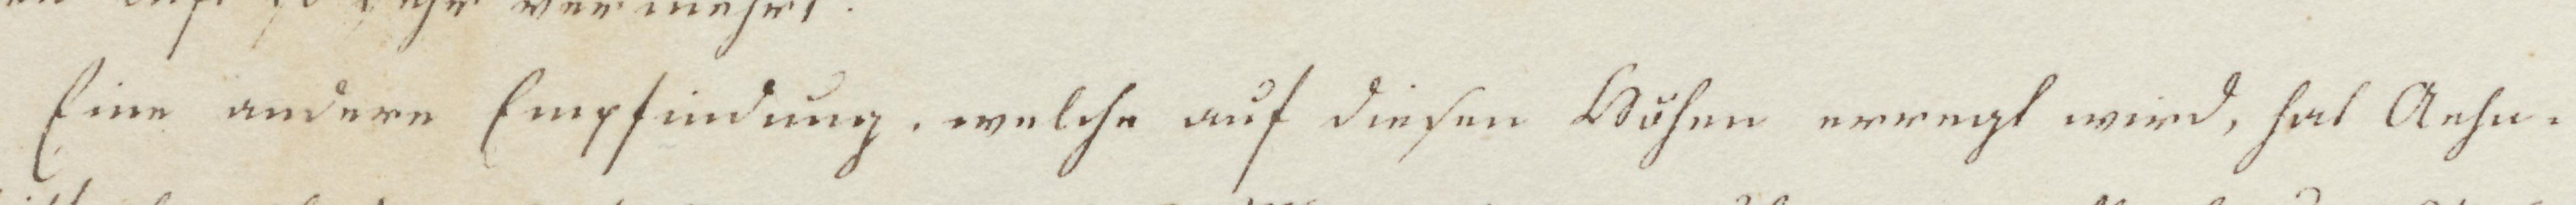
Eine andere Empfindung, welche auf diesen Höhen erregt wird, hat Aehn-
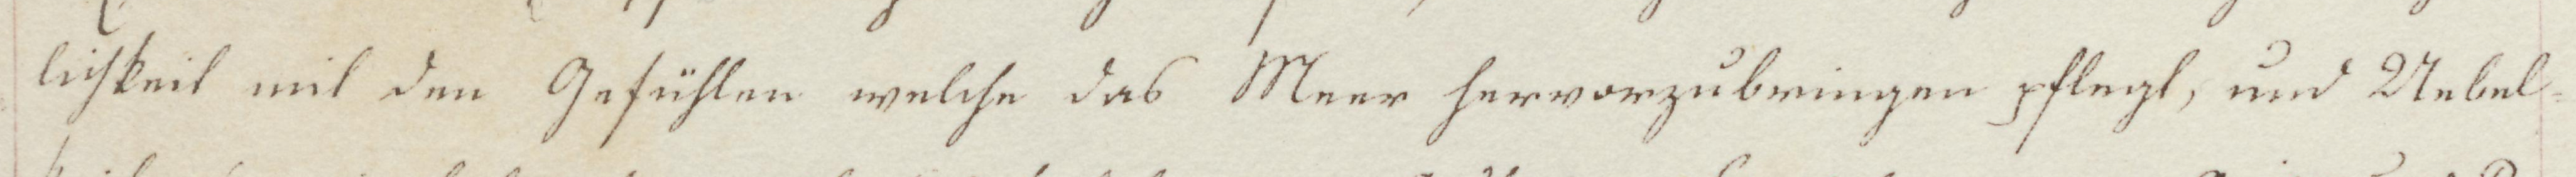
lichkeit mit den Gefühlen welche das Meer hervorzubringen pflegt, und Uebel-
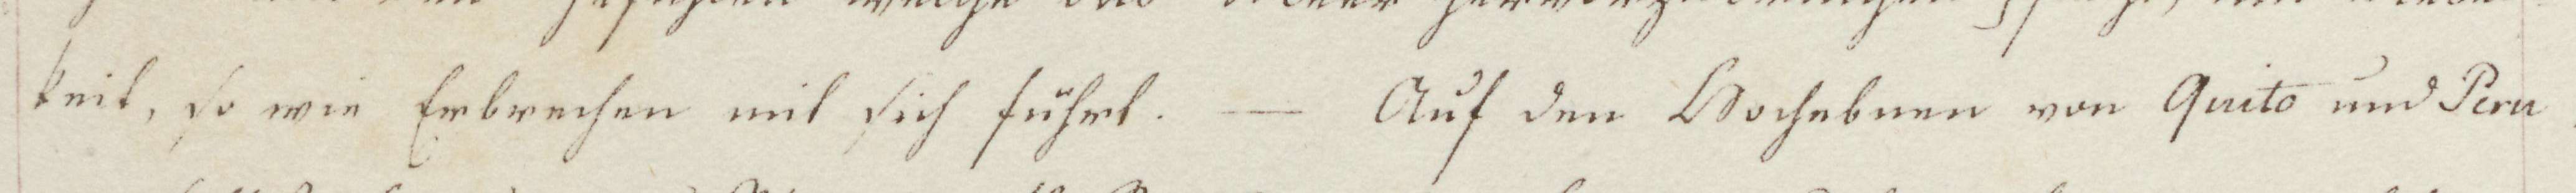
keit, so wie Erbrechen mit sich führt. – Auf den Hochebenen von Quito und Peru,
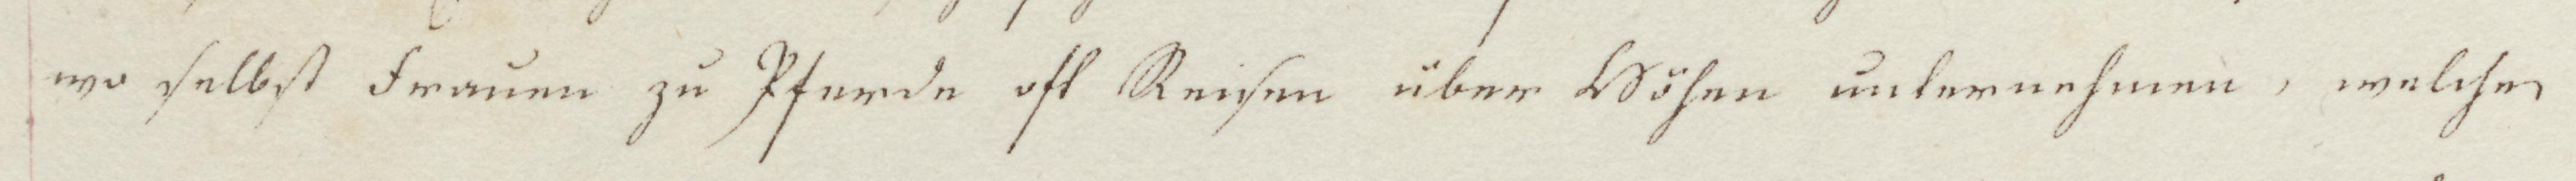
wo selbst Frauen zu Pferde oft Reisen über Höhen unternehmen, welche
